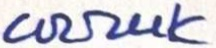сычик
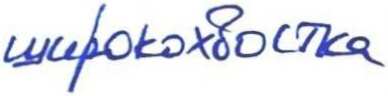широкохвостка
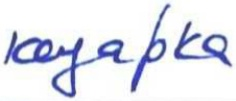казарка
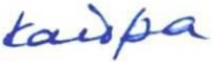кайра
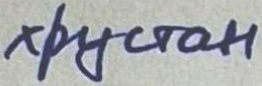хрустан
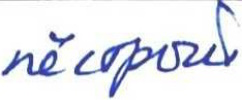пёстрый
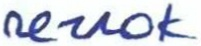чеглок
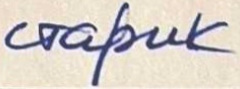старик
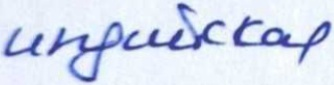индийская
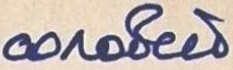соловей
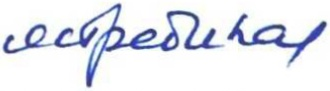ястребиная
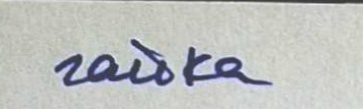чайка
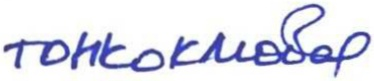тонкоклювая
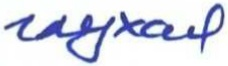глухая
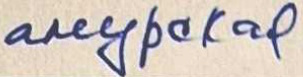амурская
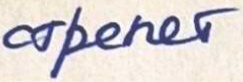стрепет
